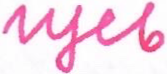гусь
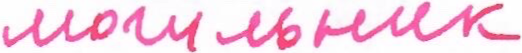могильник
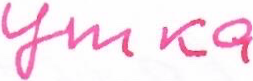утка
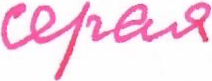серая
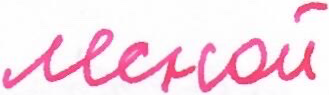лесной
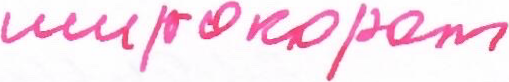широкорот
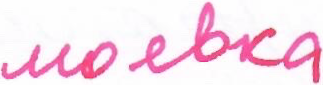моевка
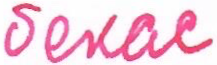бекас
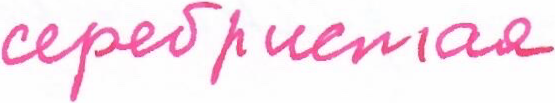серебристая
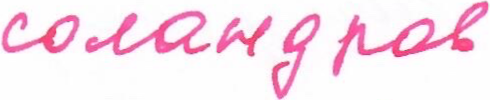соландров
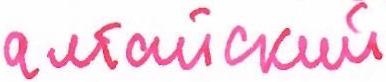алтайский
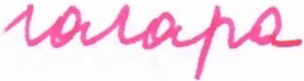гагара
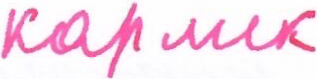карлик
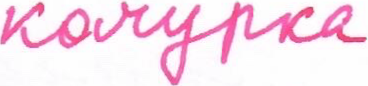качурка
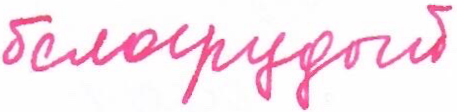белогрудый
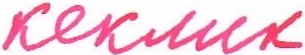кеклик
